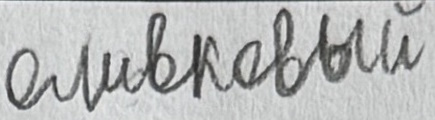оливковый
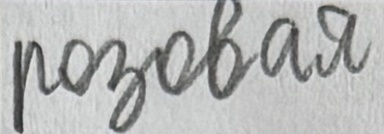розовая
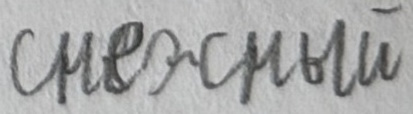снежный
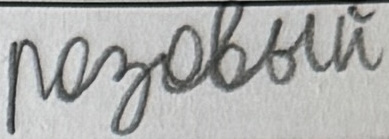розовый
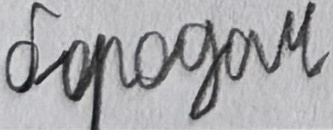бородач
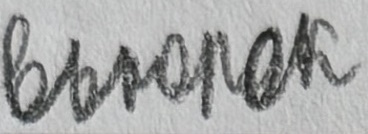вьюрок
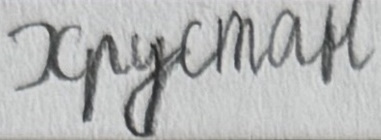хрустан
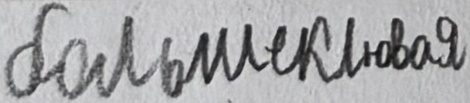большеклювая
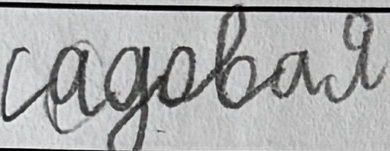садовая
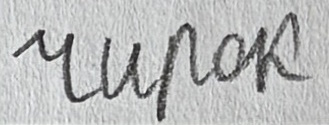чирок
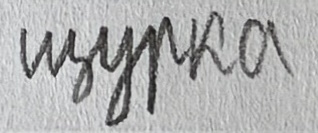щурка
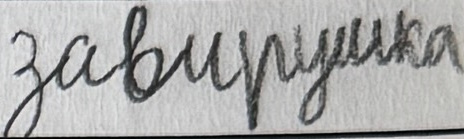завирушка
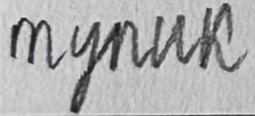тупик
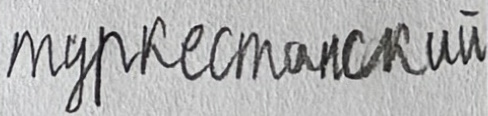туркестанский
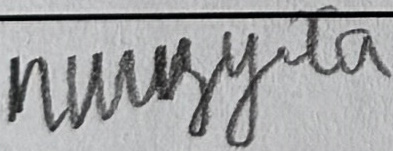пищуха
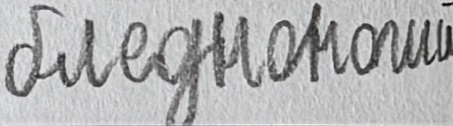бледноногий
